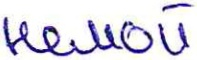немой
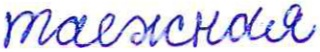таежная
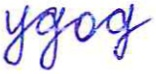удод
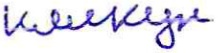кликун
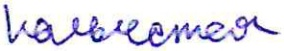кольчстея
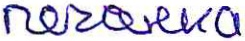пеганка
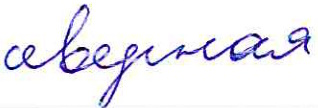северная
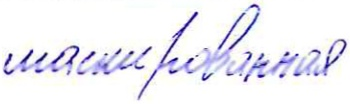маскированная
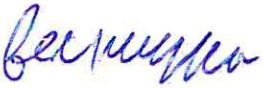весничка
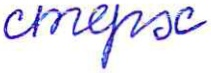стерх
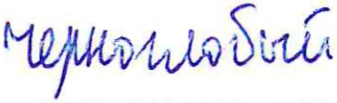черноглобый
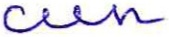сип
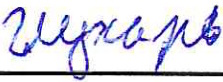глухарь
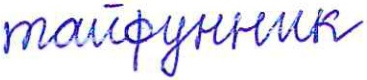тайфунник
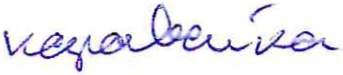каравайка
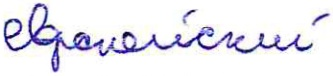европейский
